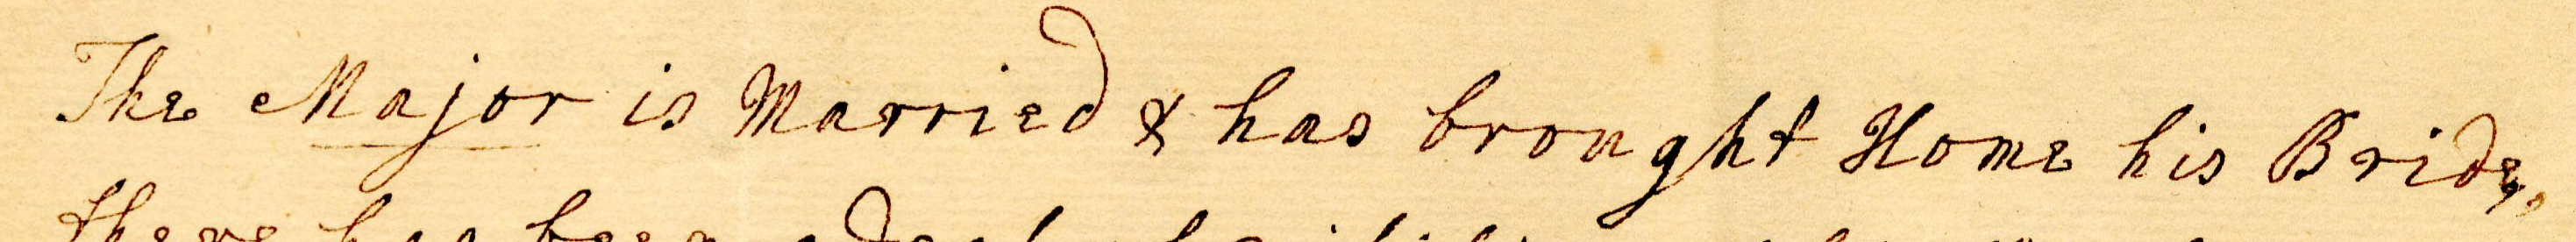The Major is Married & has brought Home his Bride,
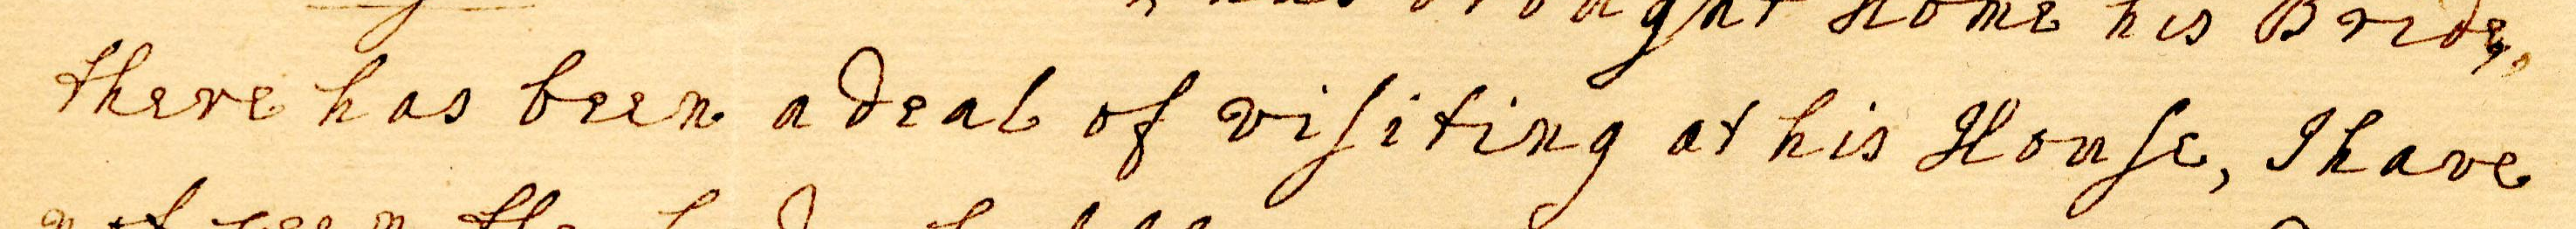there has been a deal of visiting at his House, I have
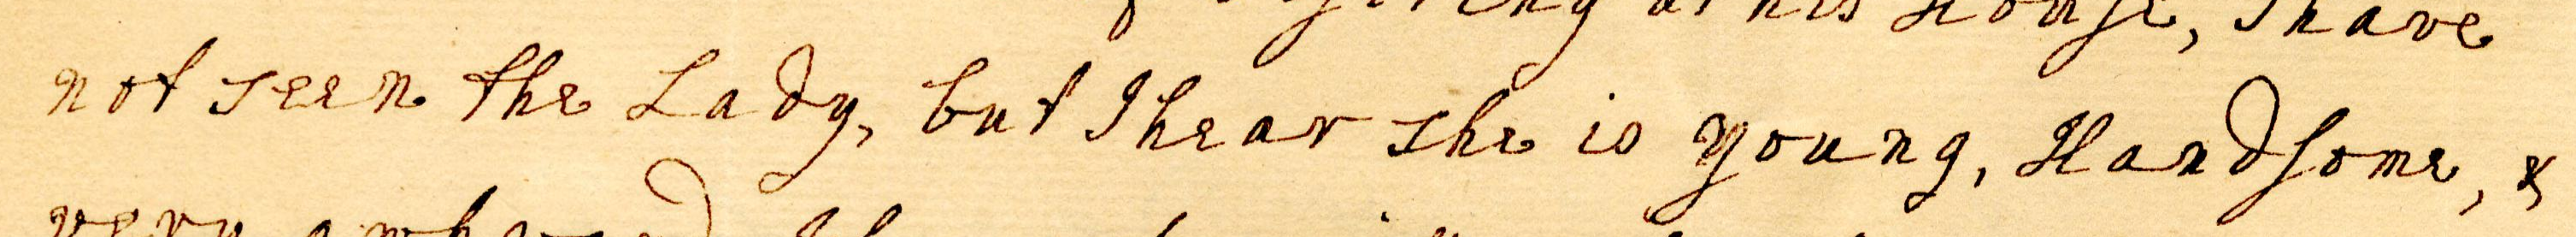not seen the Lady, but I hear se is young, Handsome, &
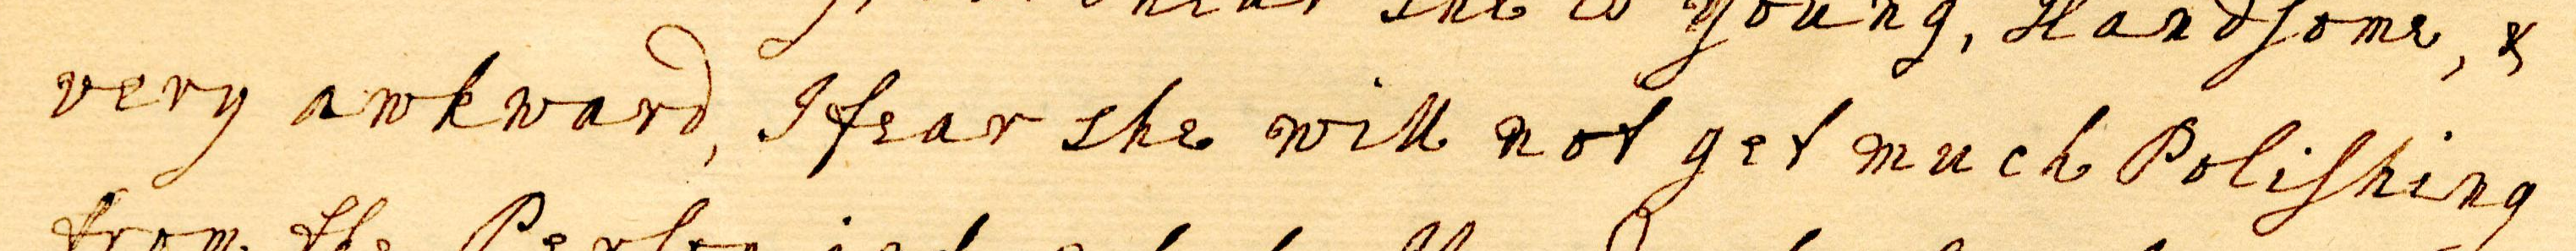very awkward, I fear she will not get much Polishing
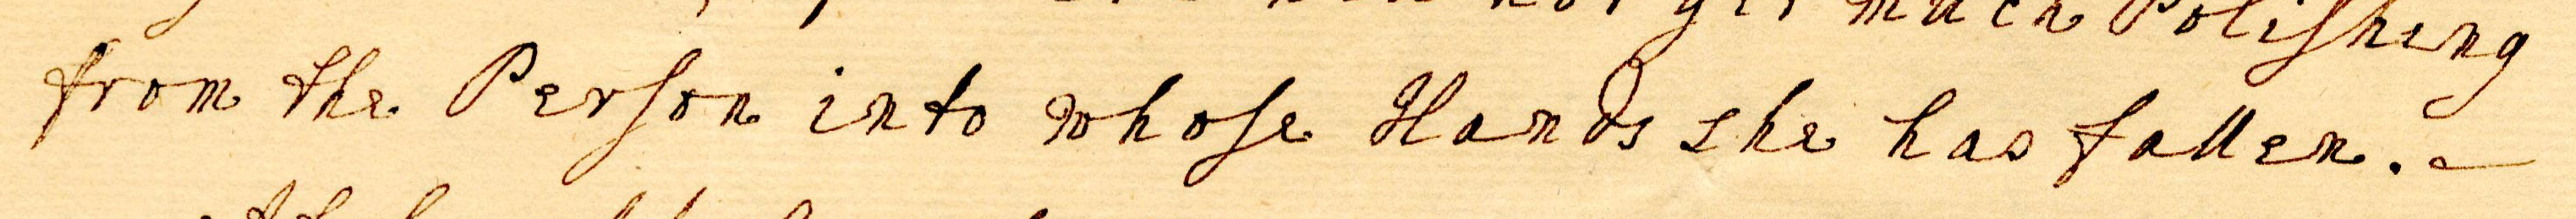from the Person into whose Hands she has fallen.-
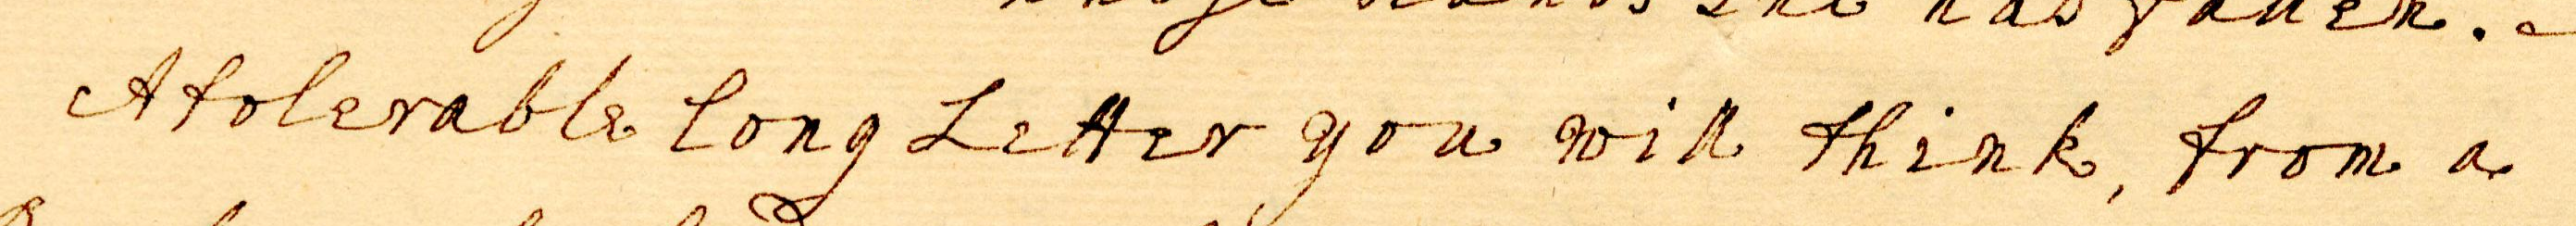A tolerable long Letter you will think, from a
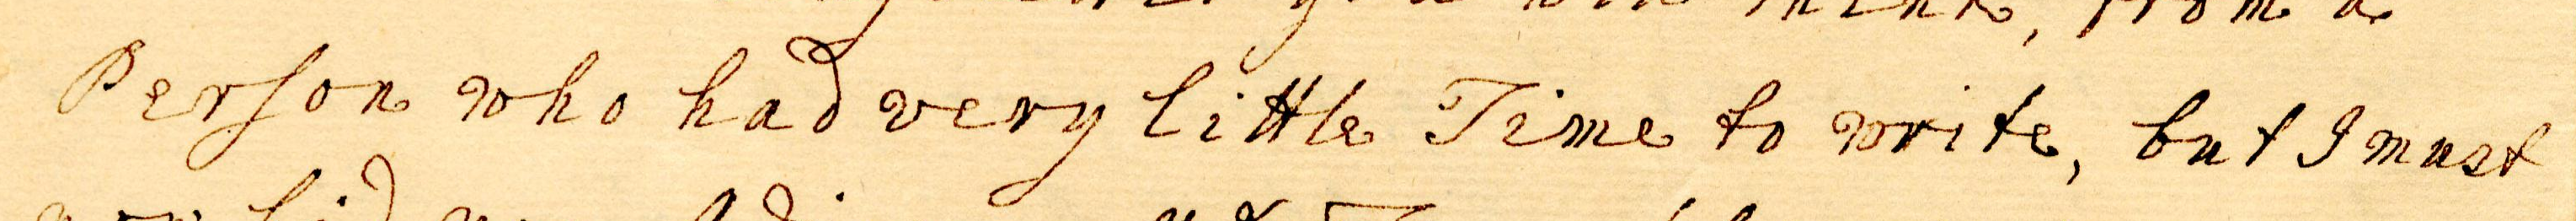Person who had very little Time to write, but I must
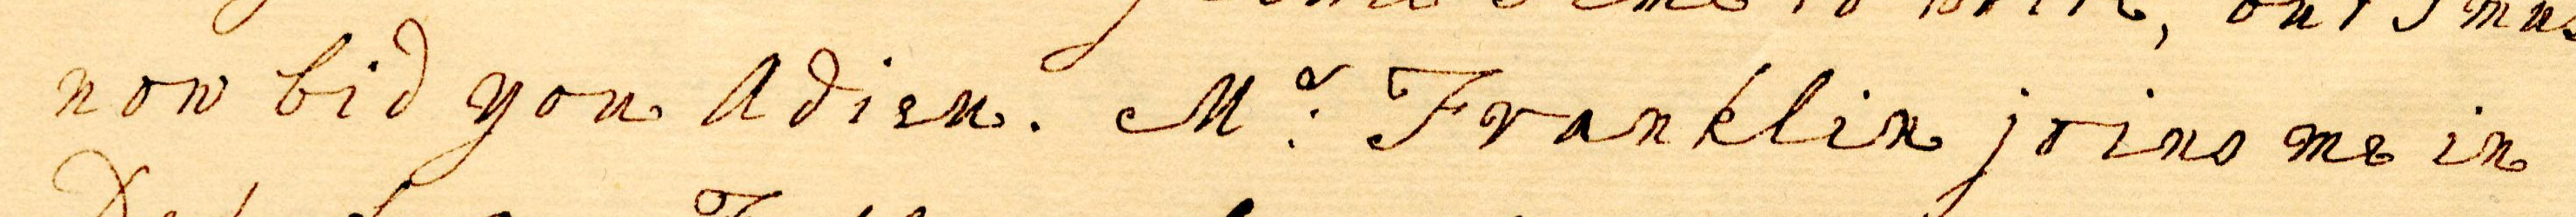now bid you Adieu. M^r: Franklin joins me in
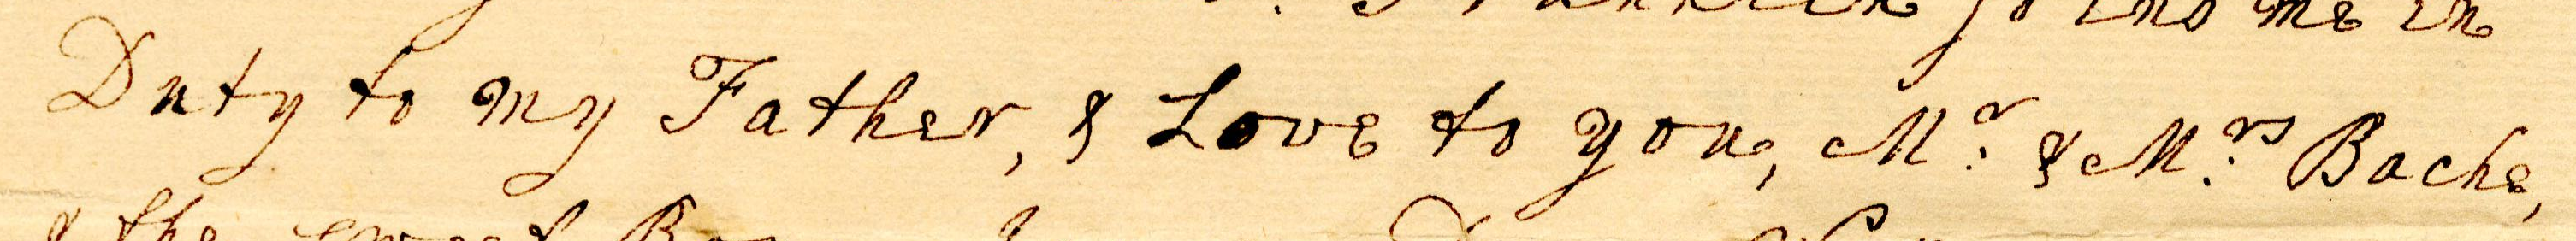Duty to my Father, & Love to you, M^r: & M^rs: Bache,
